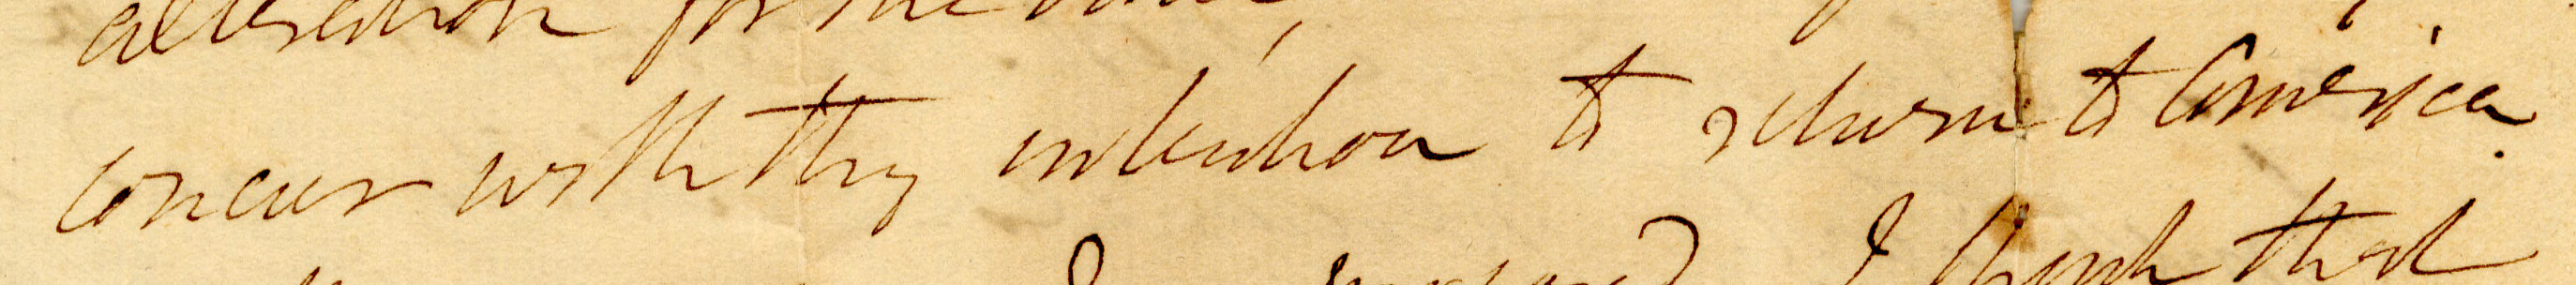concur with thy intention to return to America
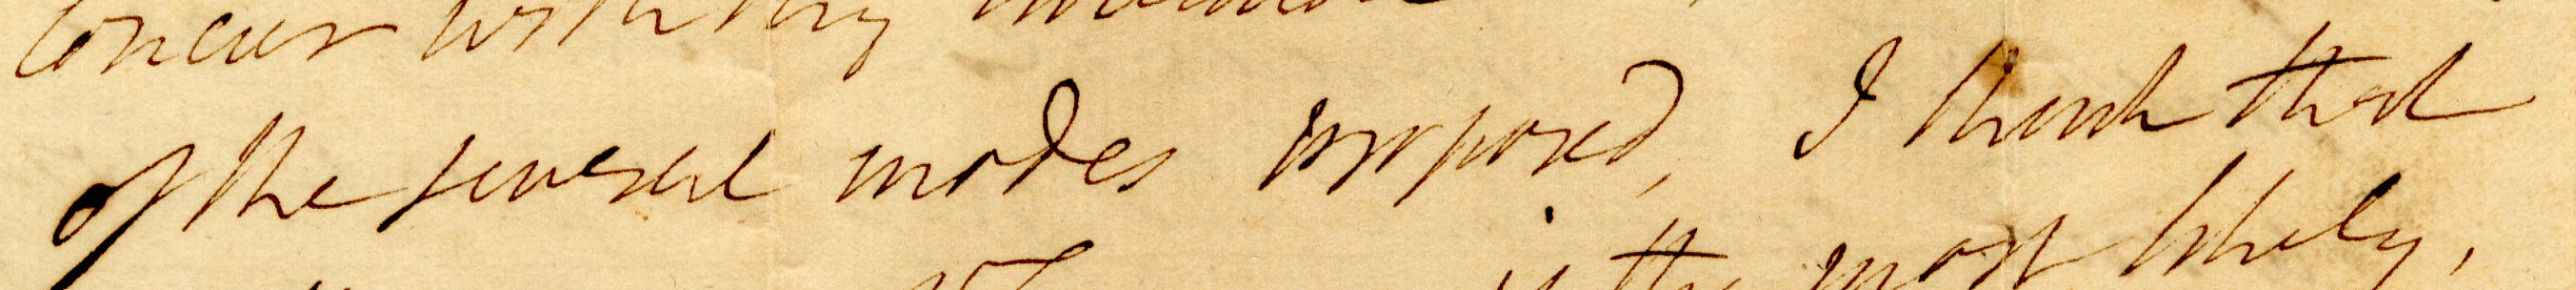of the several modes proposed. I think that
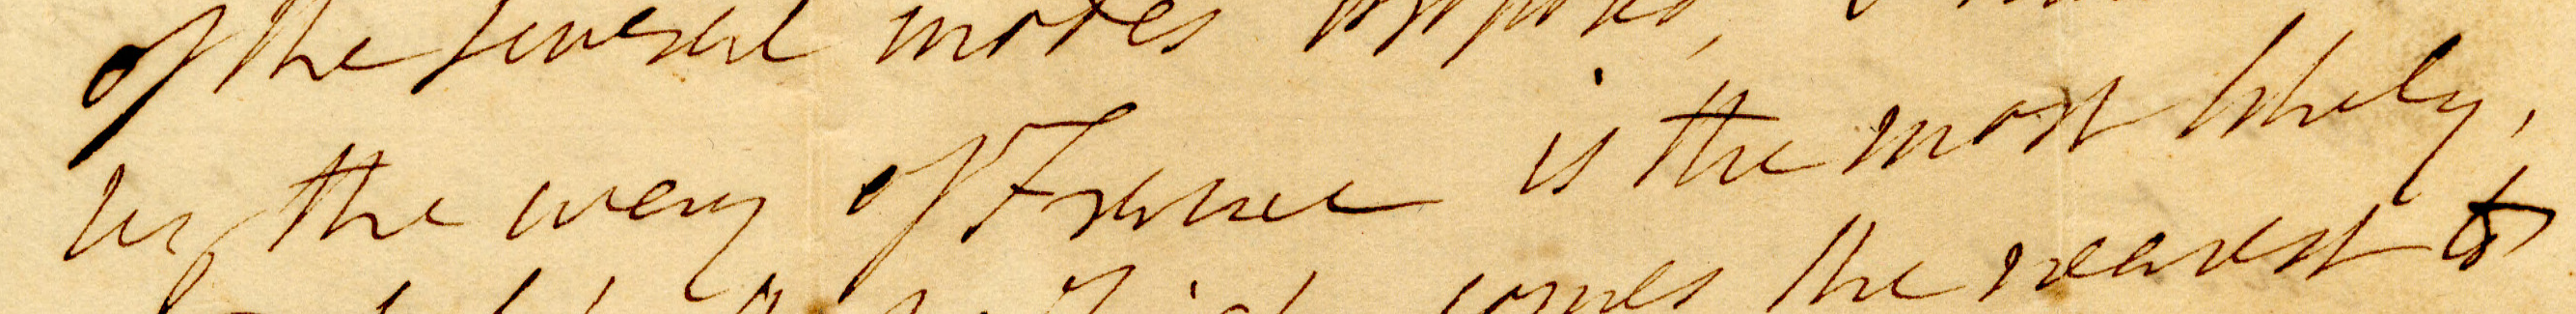by the way of France is the most likely,
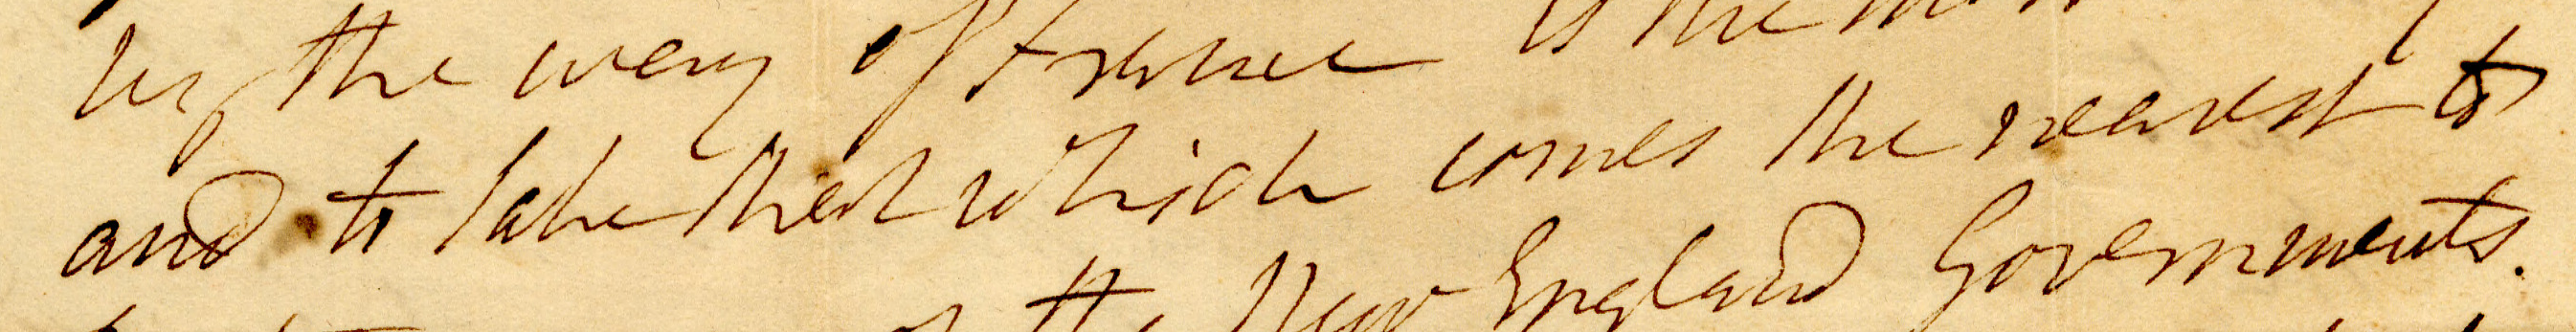and to take that which comes nearest to
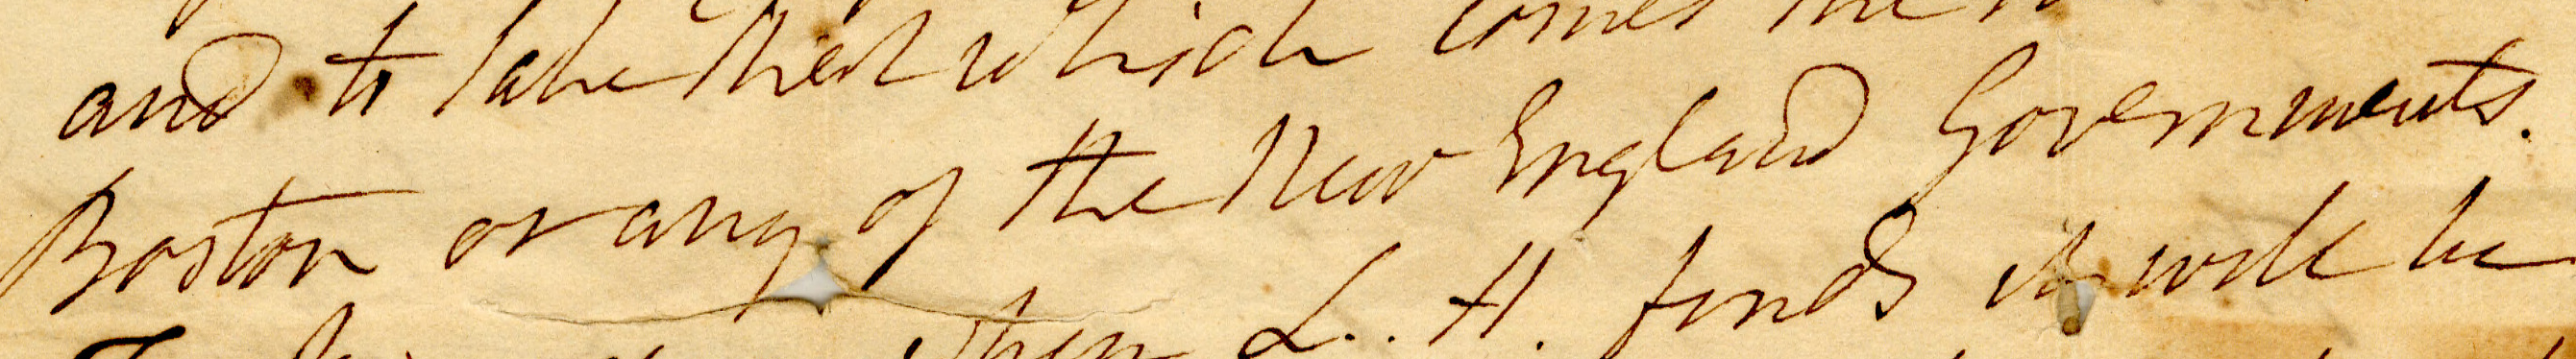Boston or any of the New England Governments.
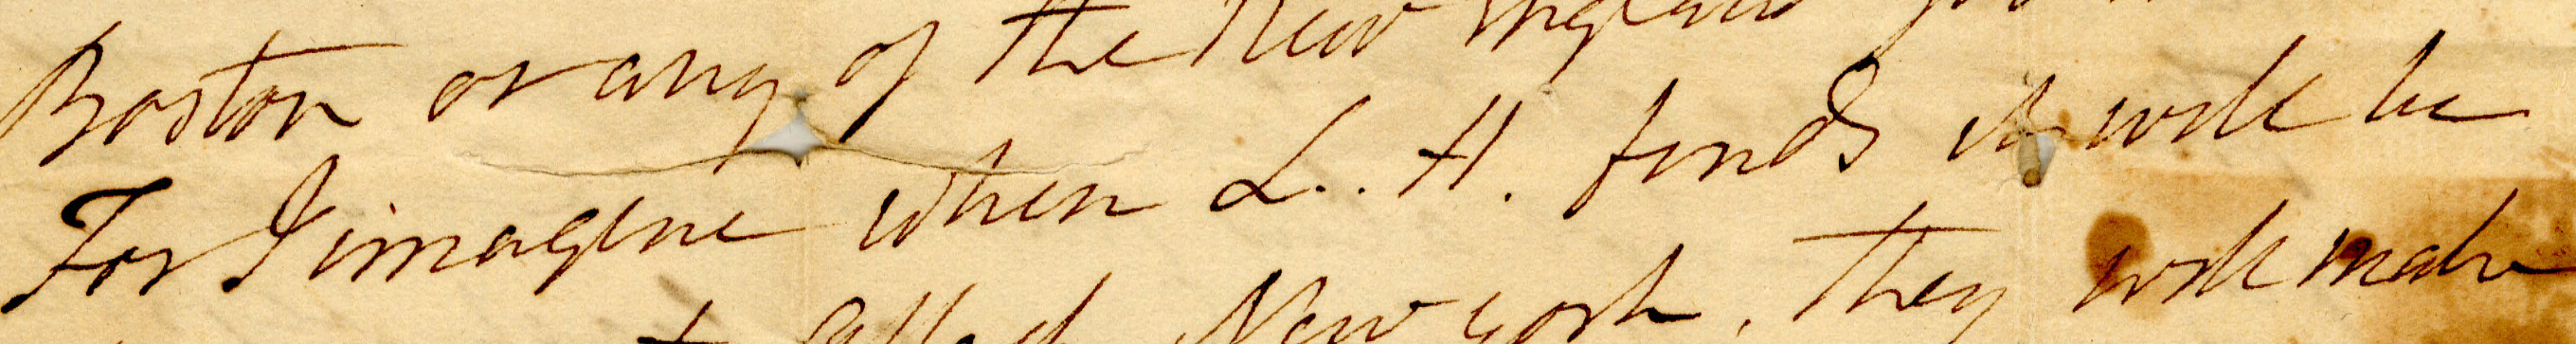For I imagine when L.. H. finds it will be
